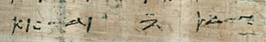κιϲται ζ ͰδⲺ𐅀
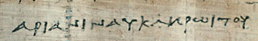αριανιναυκληρωιτου
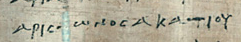αριϲτωνοϲακατιου
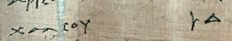χαλκου Ͱδ
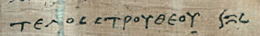τελοϲϲτρουθεου ∫≈𐅵
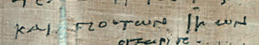και ποτων ιͰ ων
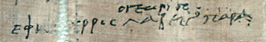εφη ρροϲλαβεινπαρα
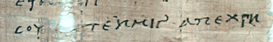ϲου τεημιν απεχρη
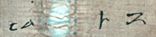ϲα Ͱ ζ
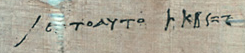/ ε τοαυτο Ͱ κβ ∫≈𐅀
